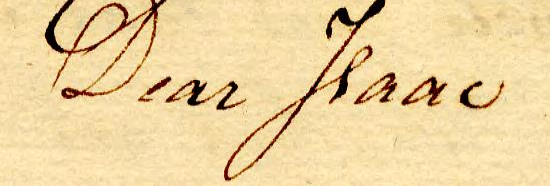Dear Isaac
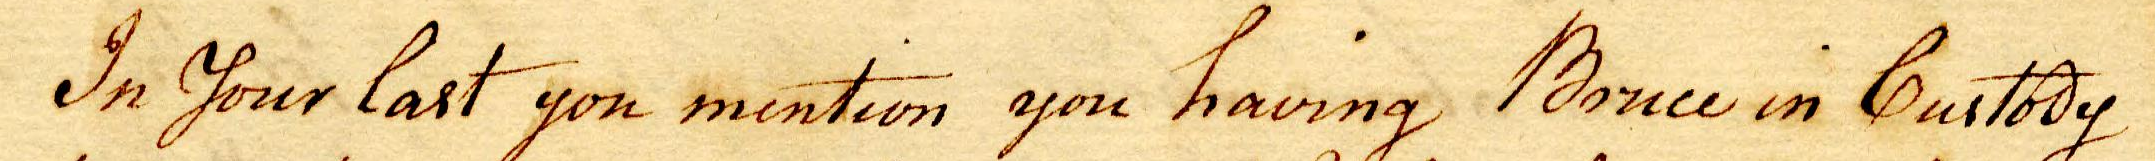In Your last you mention you having Bruce in Custody
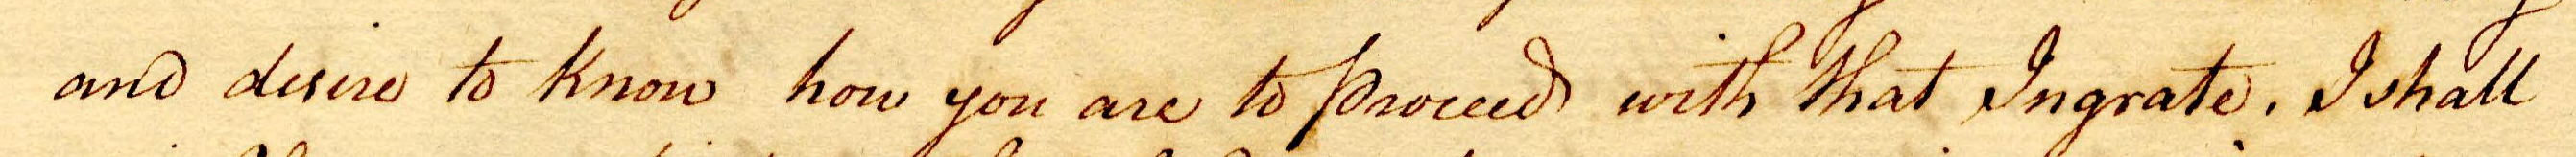and desire to know how you are to proceed with that Ingrate. I shall
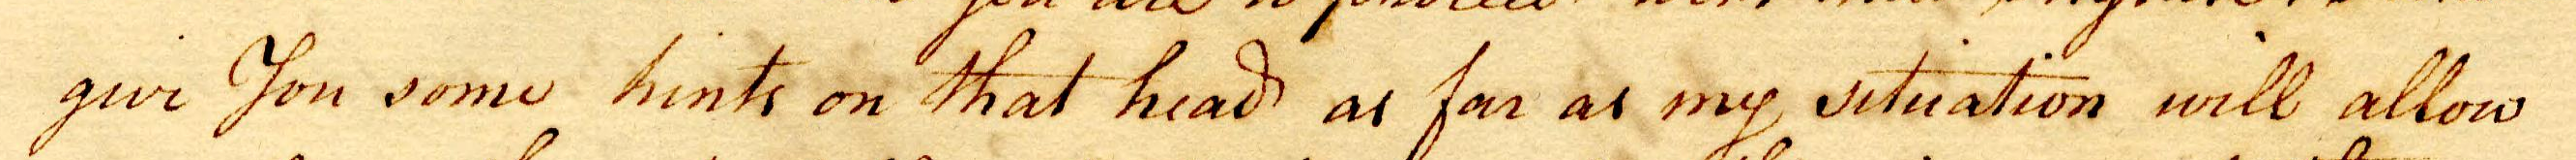give You some hints on that head as far as my situation will allow
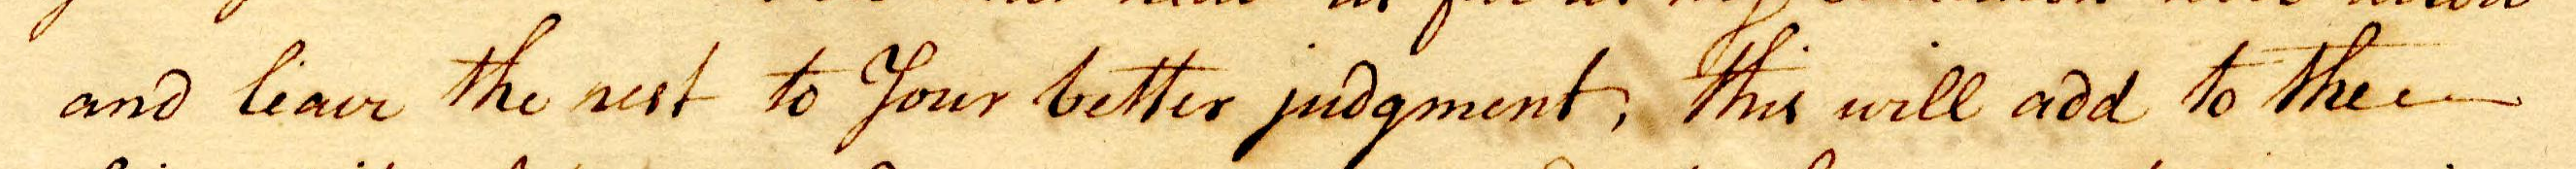and leave the rest to Your better judgment, this will add to their
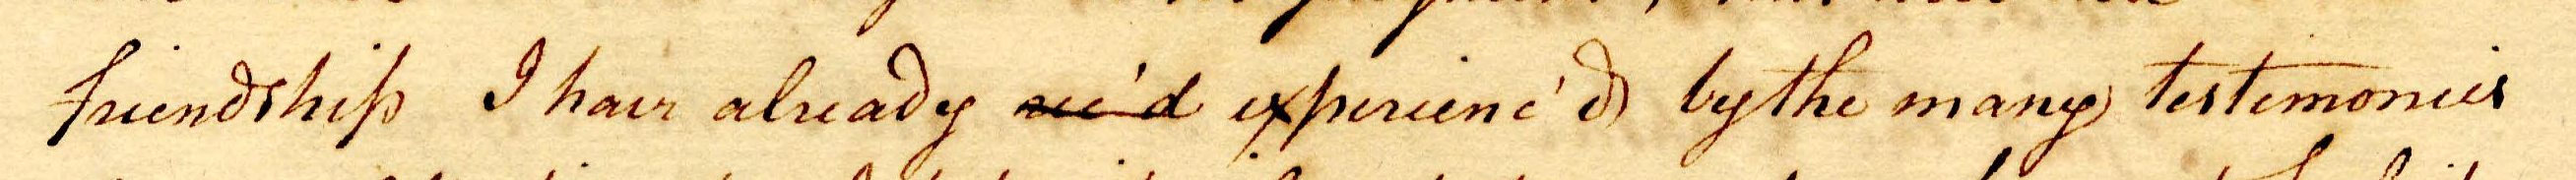friendship I have already rec'd experienc'd by the many testimonies
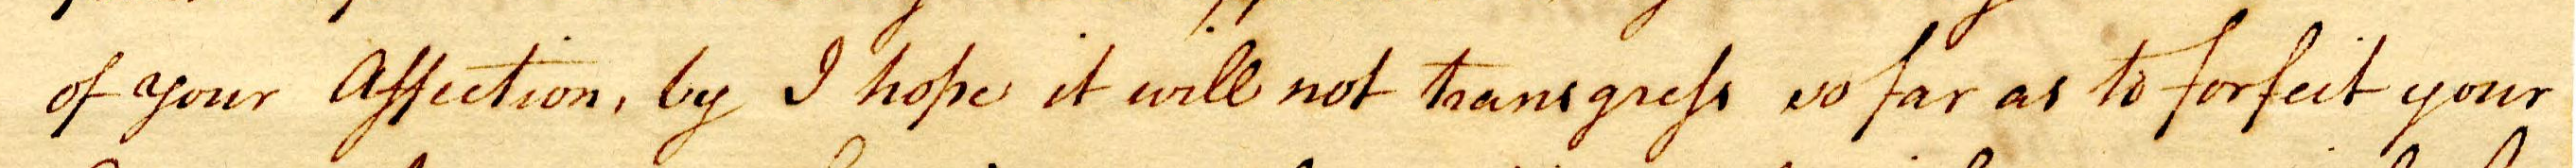of your Affection, by I hope it will not transgress so far as to forfeit your
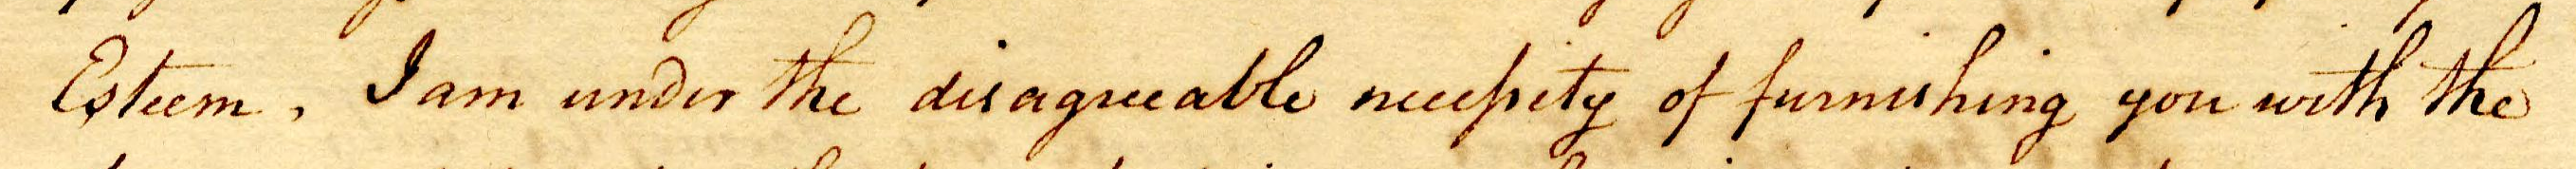Esteem. I am under the disagreeable necessity of furnishing you with the
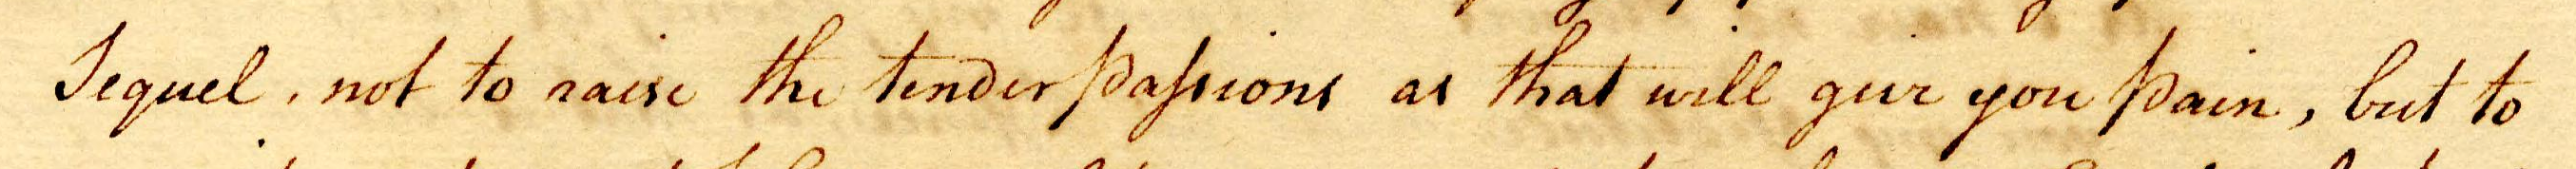Sequel not to raise the tender passions as that will give you pain, but to
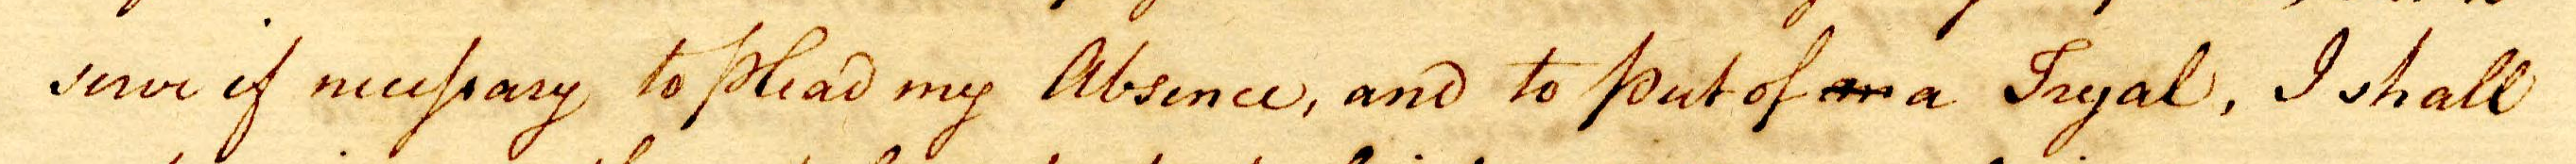serve if necessary to plead my Absence, and to put of on a Tryal, I shall
